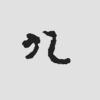九
